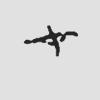才
